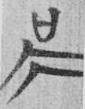吳
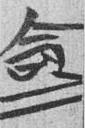命
